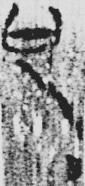也
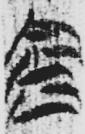金
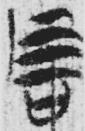石
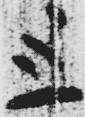之
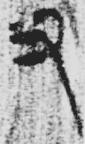又（有）
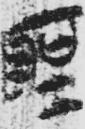○（聲）
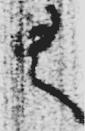也
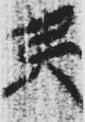弗
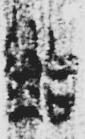鉤（扣）
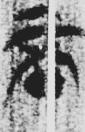不
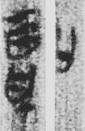鳴
